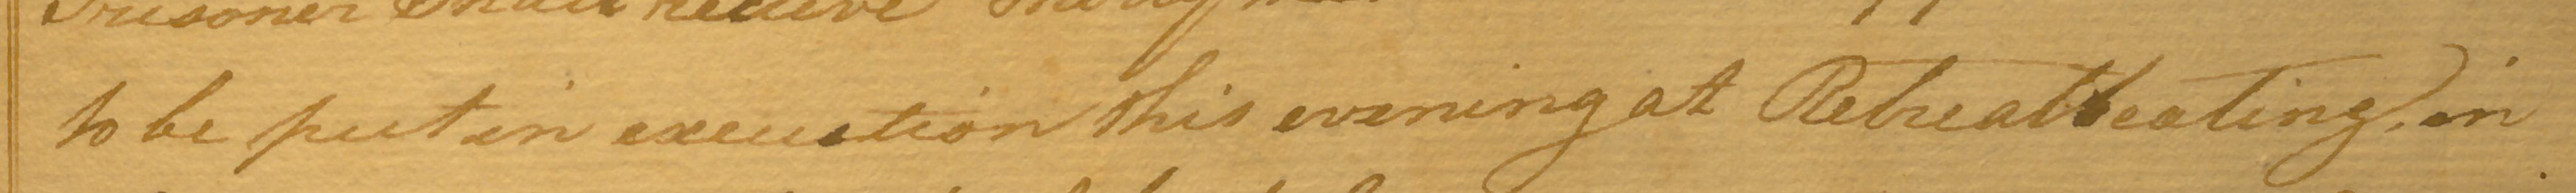to be put in execution this evening at Retreatbeating in
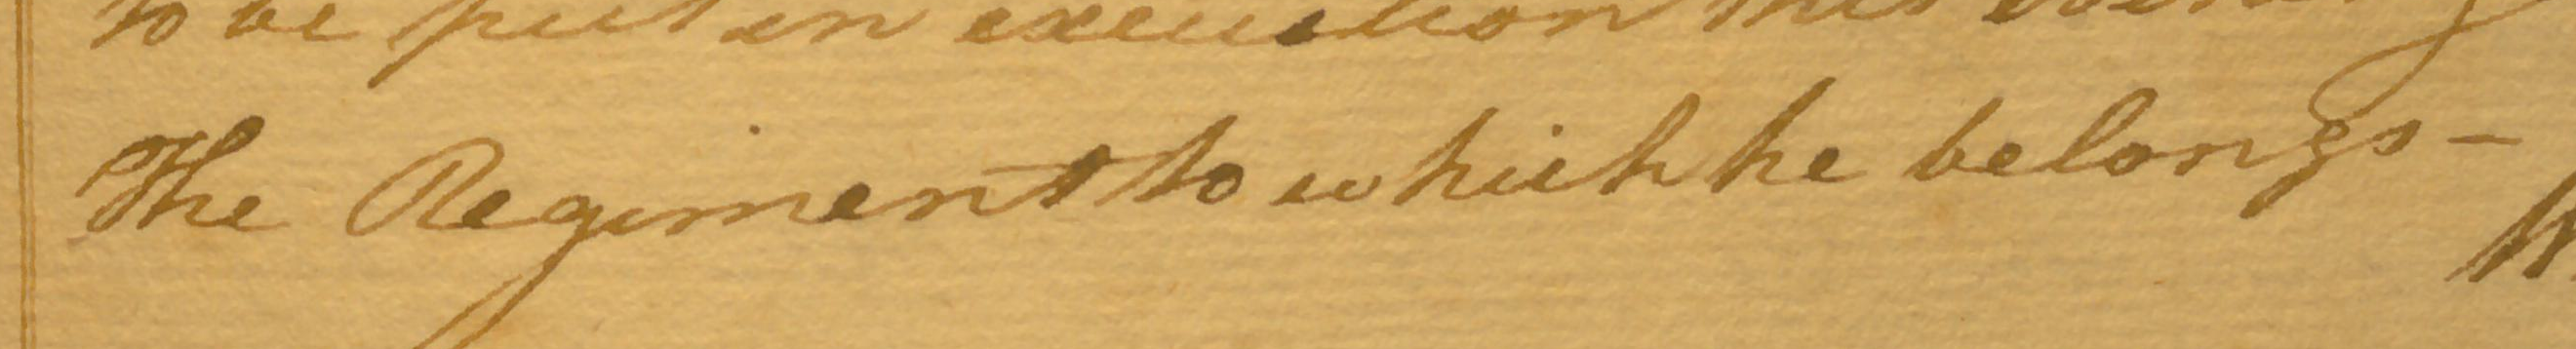The Regiment to which he belongs-
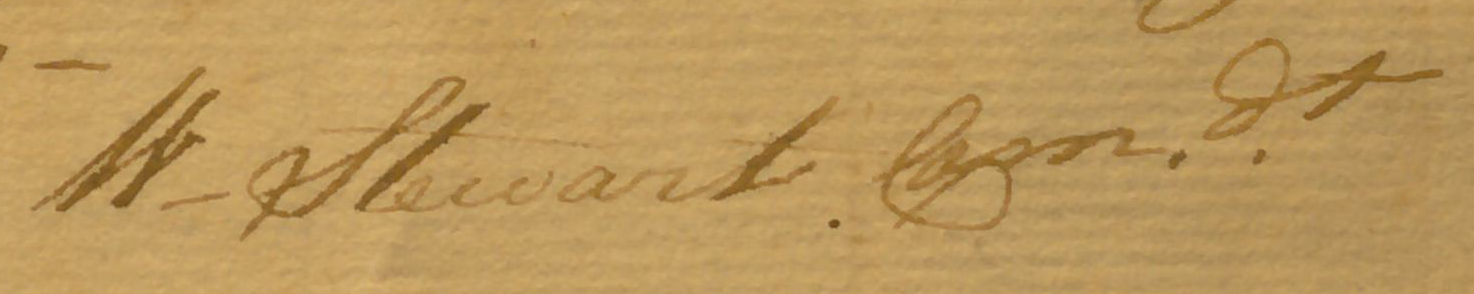W. Stewart Com^dt.
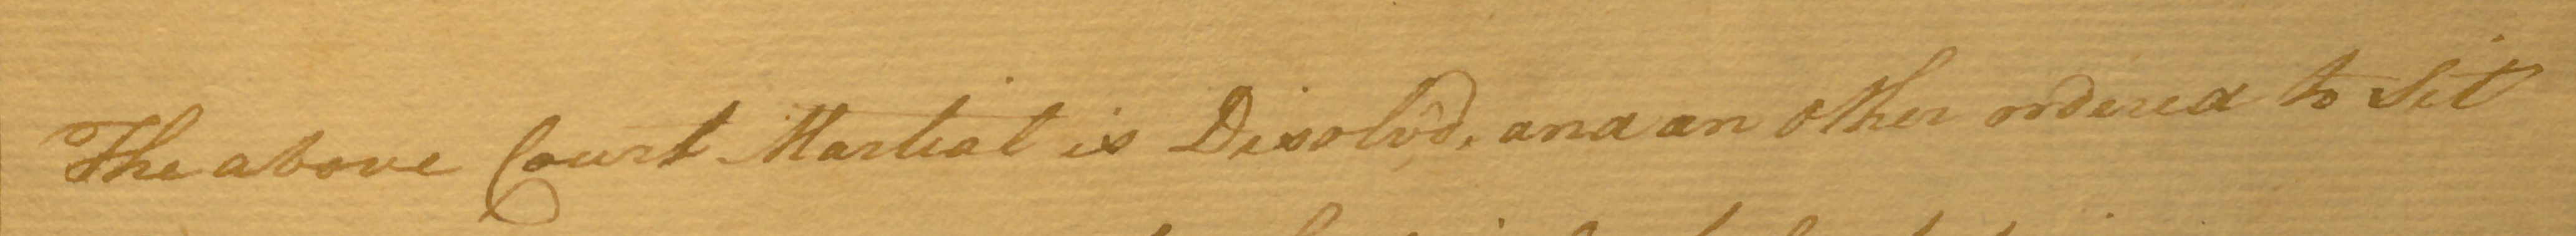The above Court Martial is Disolv'd, and an other ordered to Sit
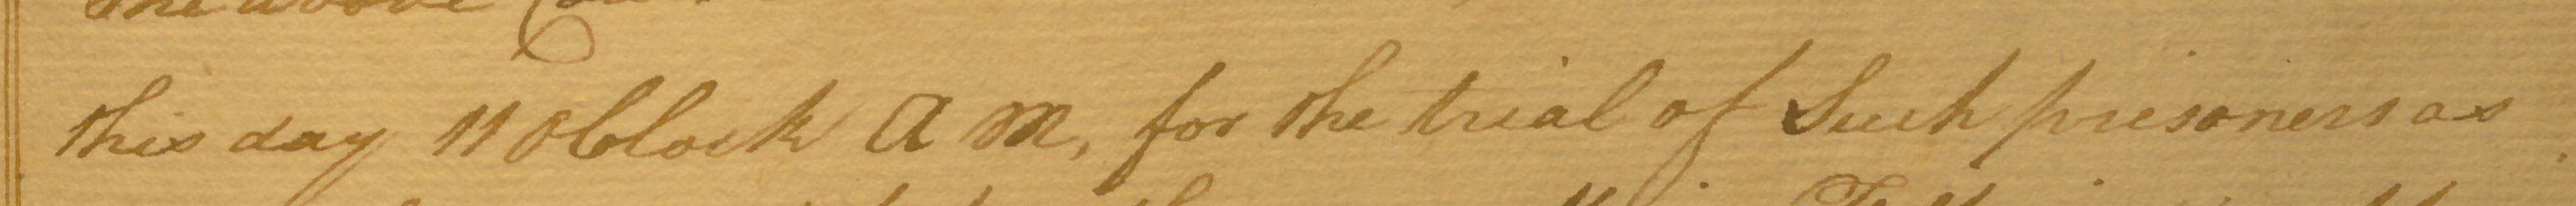this day 11 oClock A M, for the trial of Such prisoners as
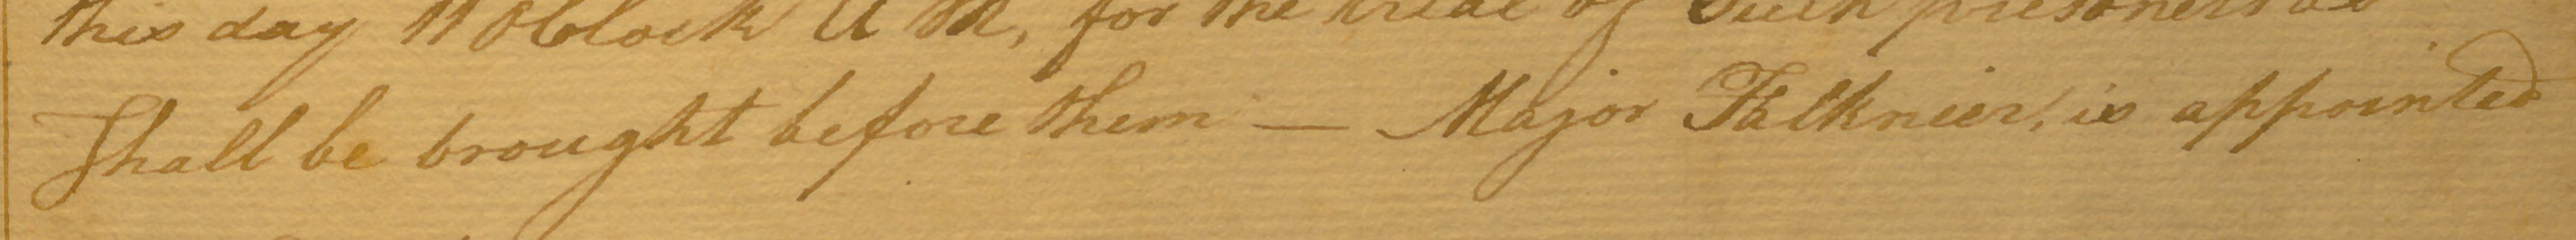Shall be brought before them- Major Falknier, is appointed
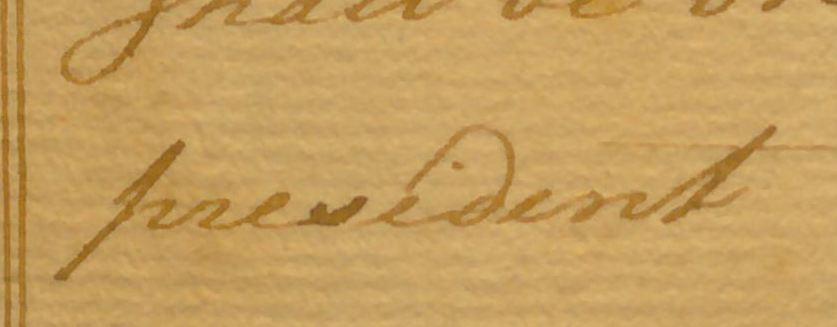president
